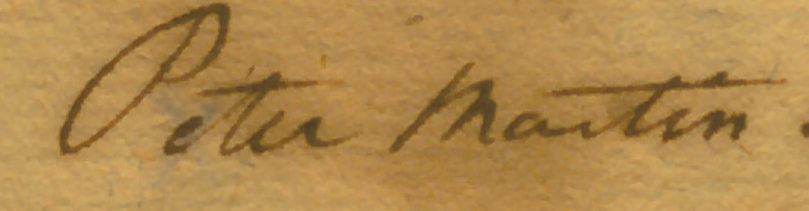Peter Martin.
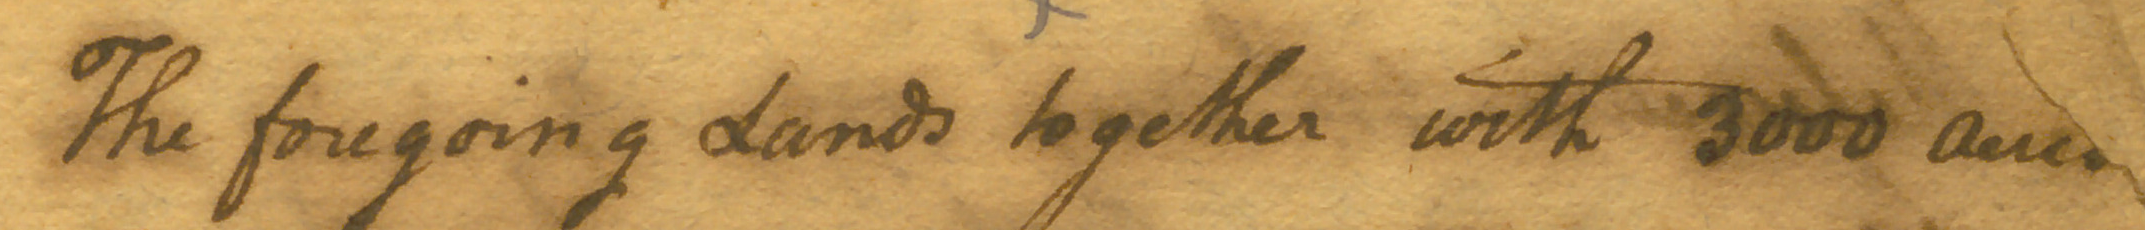The foregoing Lands together with 3000 acres
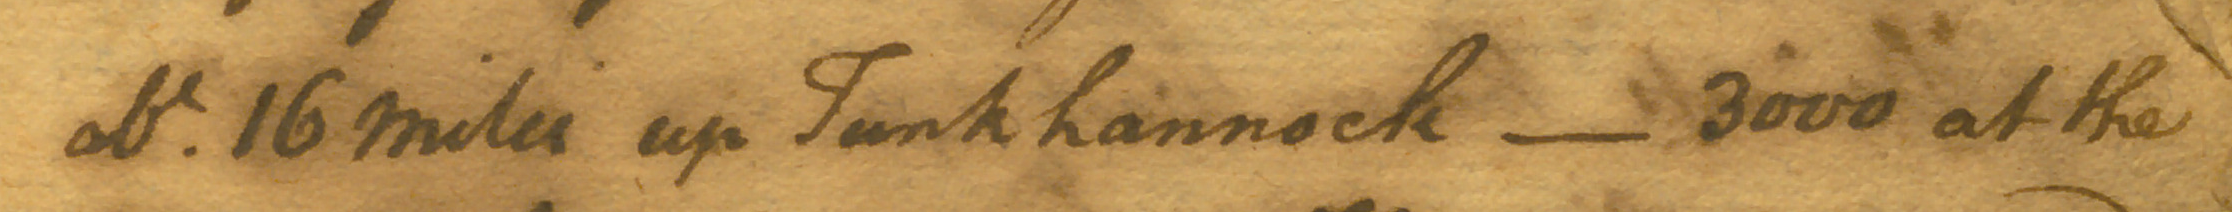ab^t. 16 miles up Tunkhannoch- 3000 at the
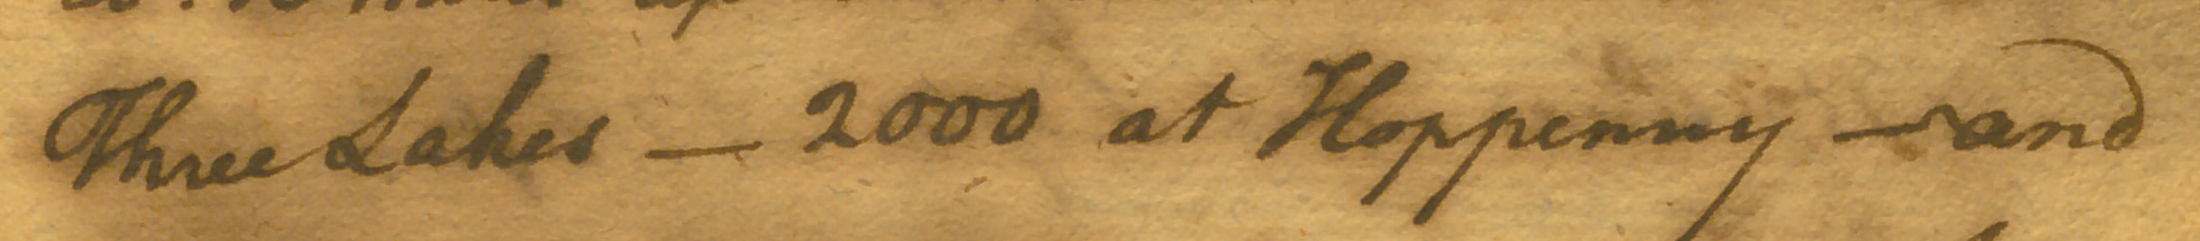Three Lakes- 2000 at Hoppenny- and
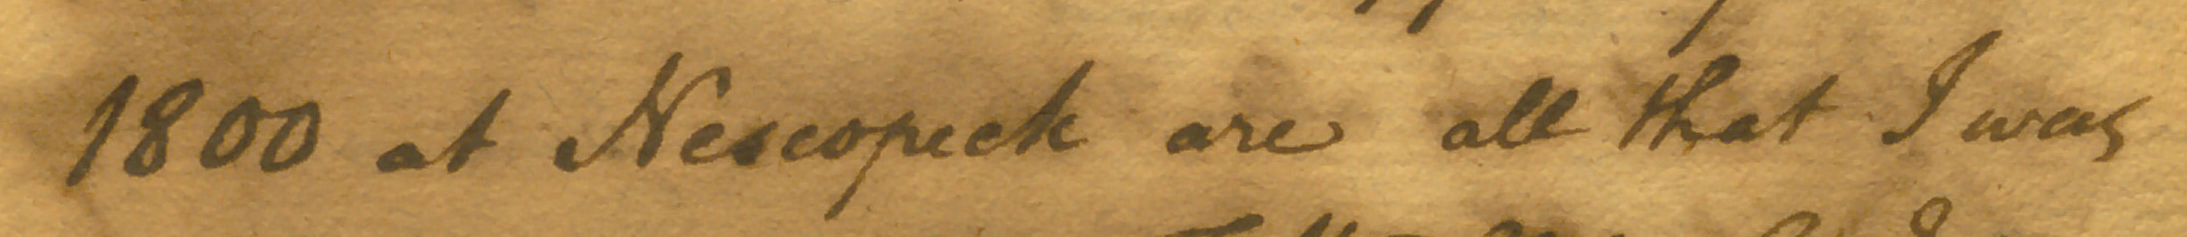1800 at Nescopeck are all that I was
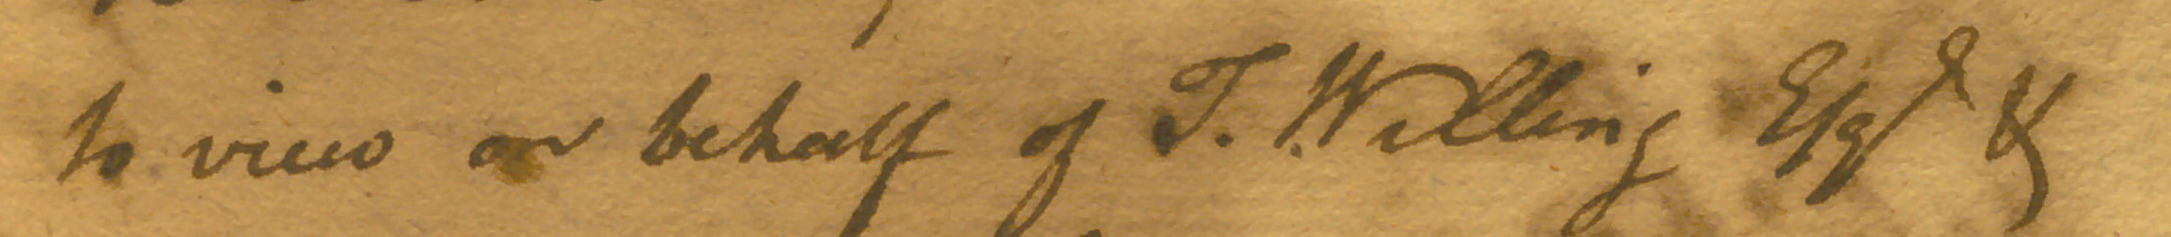to view on behalf of T. Willing Esq^r &
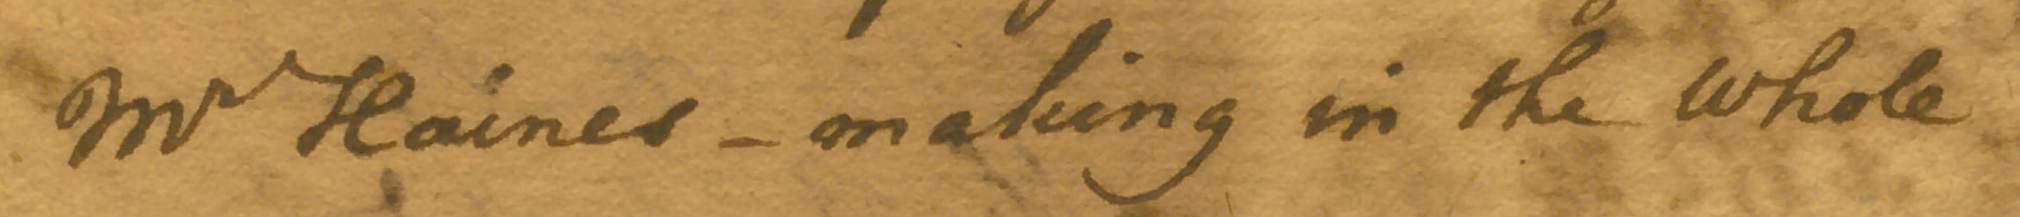M^r Haines- making in the whole
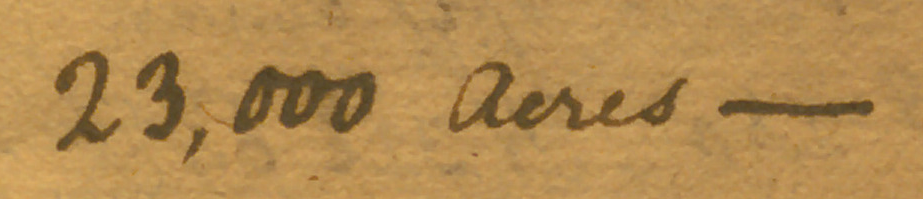23,000 acres-
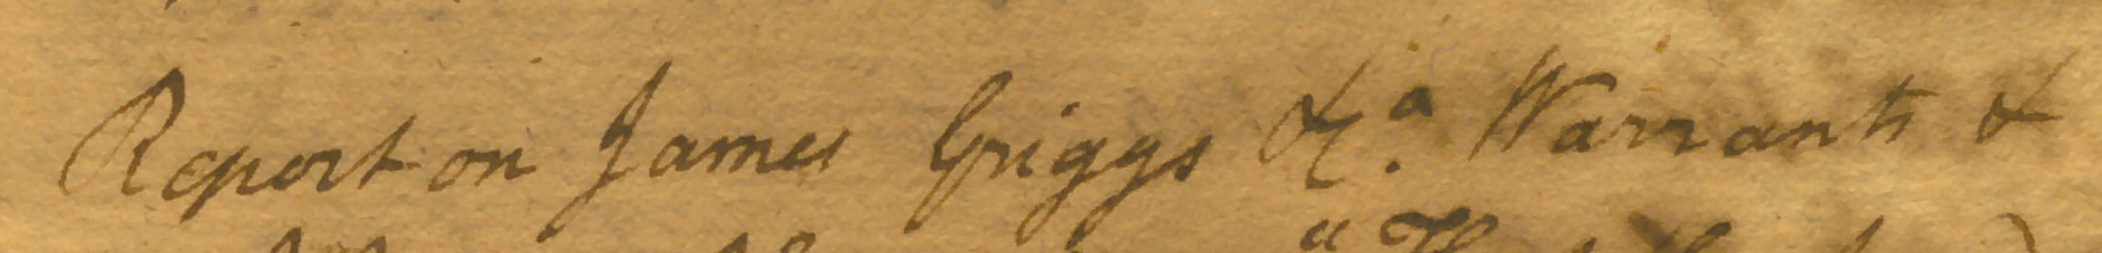Report on James Griggs &c^a. Warrants &
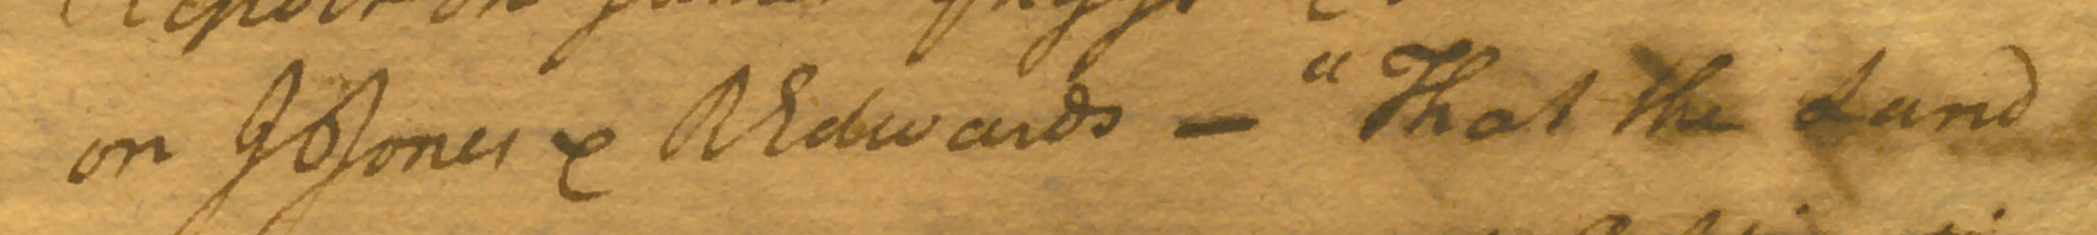on J Jones & R Edwards-"That the Land
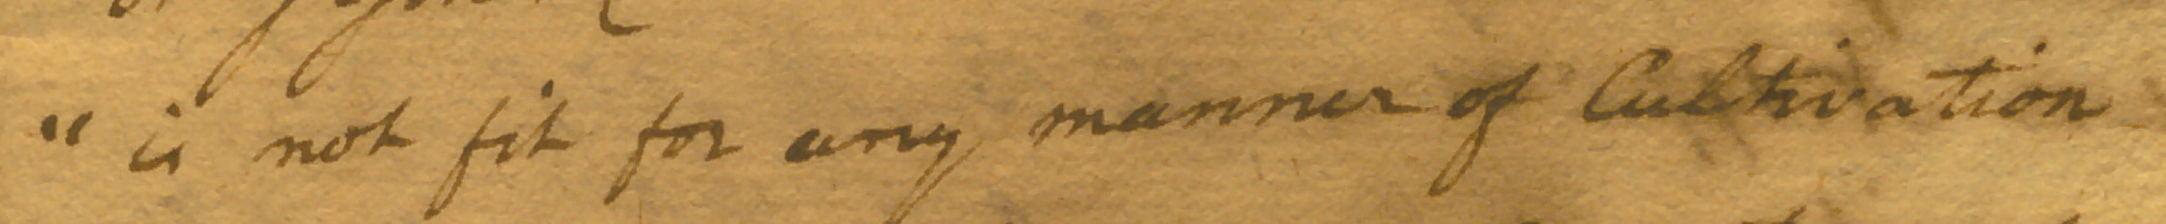"is not fit for any manner of Cultivation
